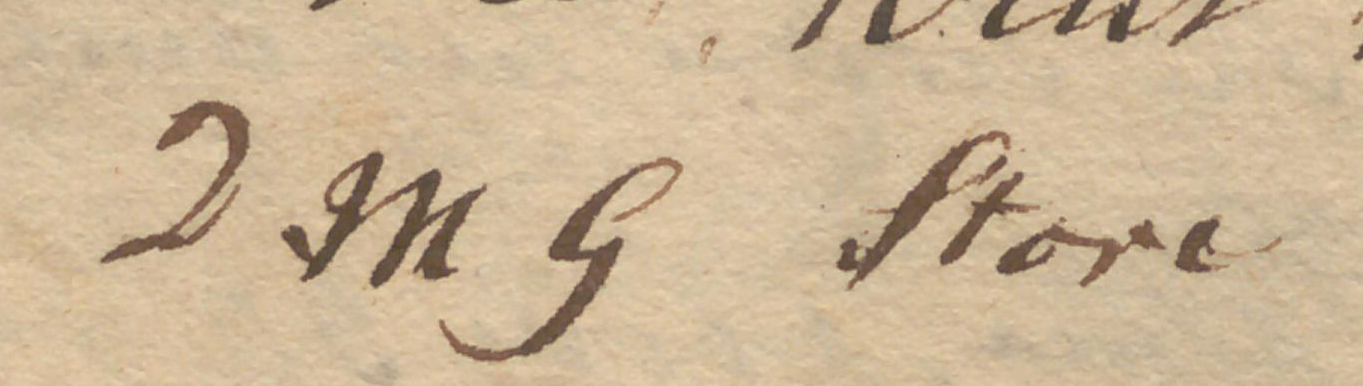QMG Store
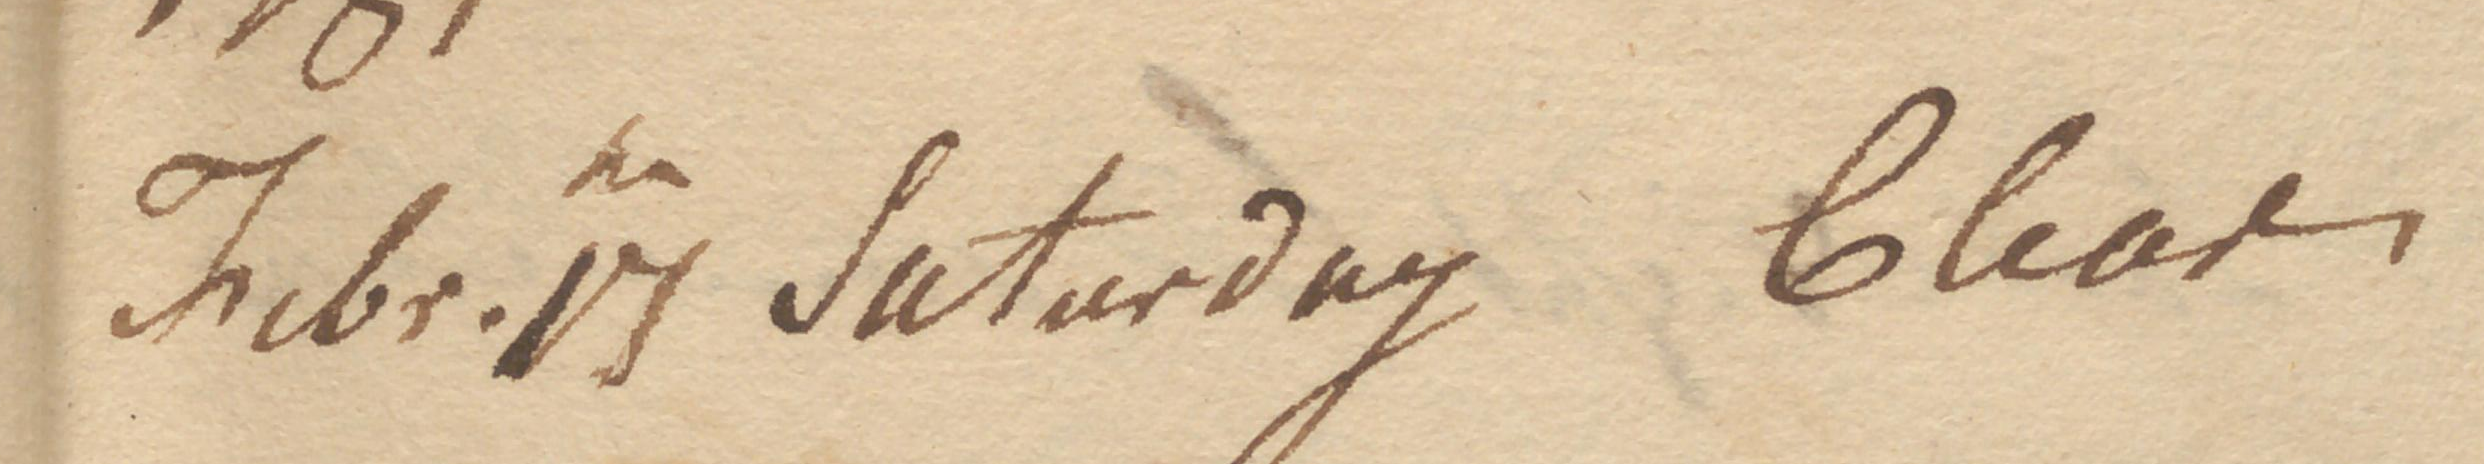Febr. 17^th Saturday Clear
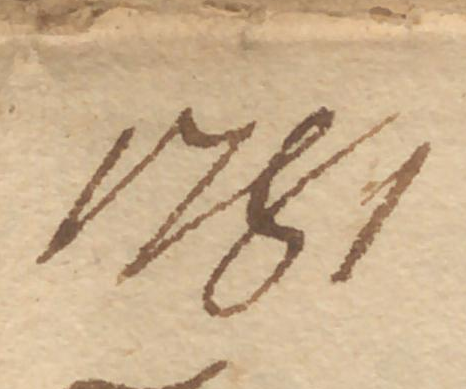1781
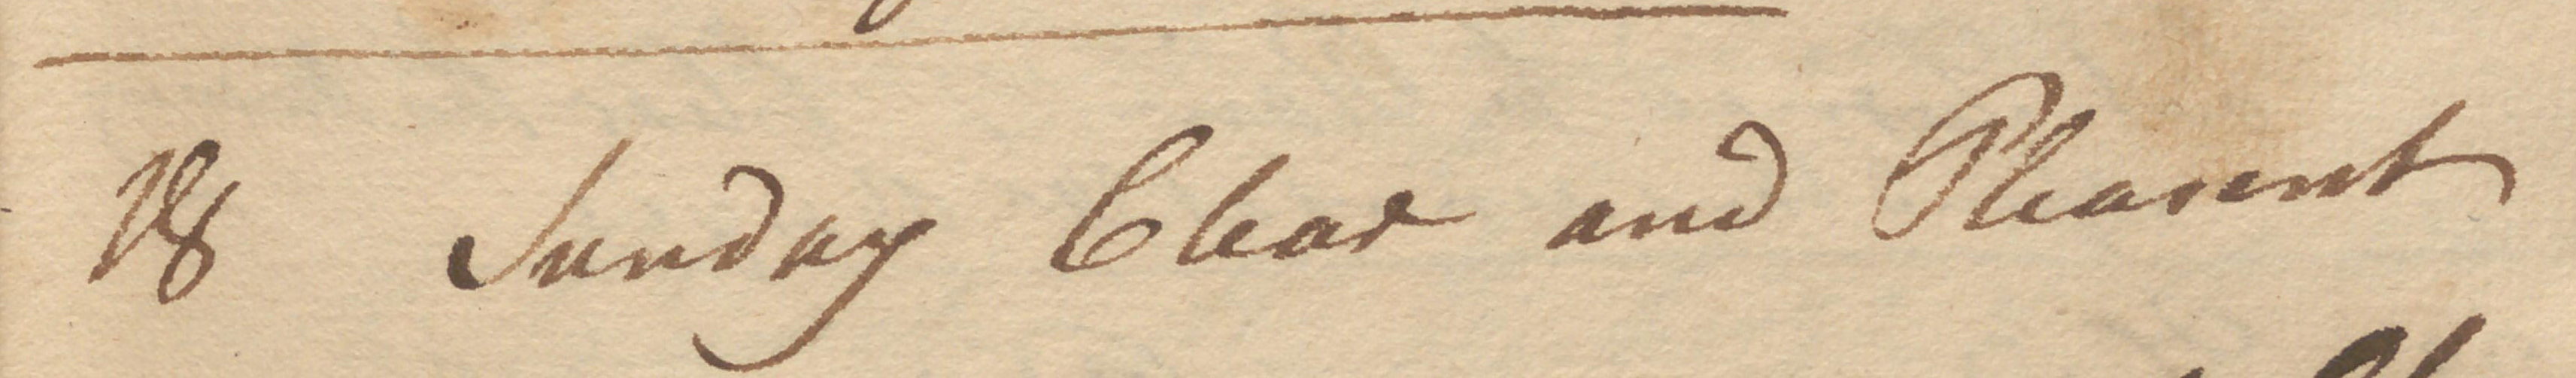18 Sunday Clear and Pleasent
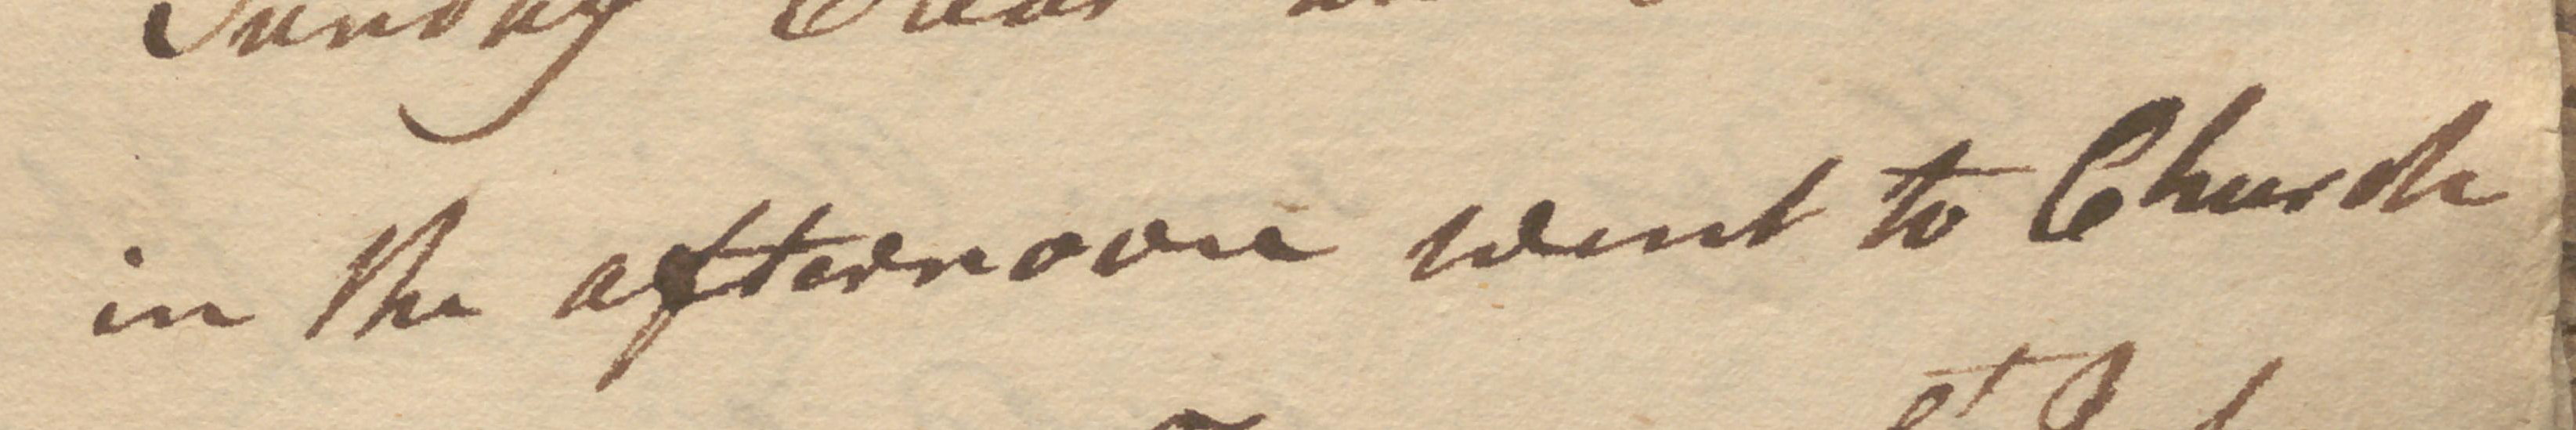in the afternoon went to Church
